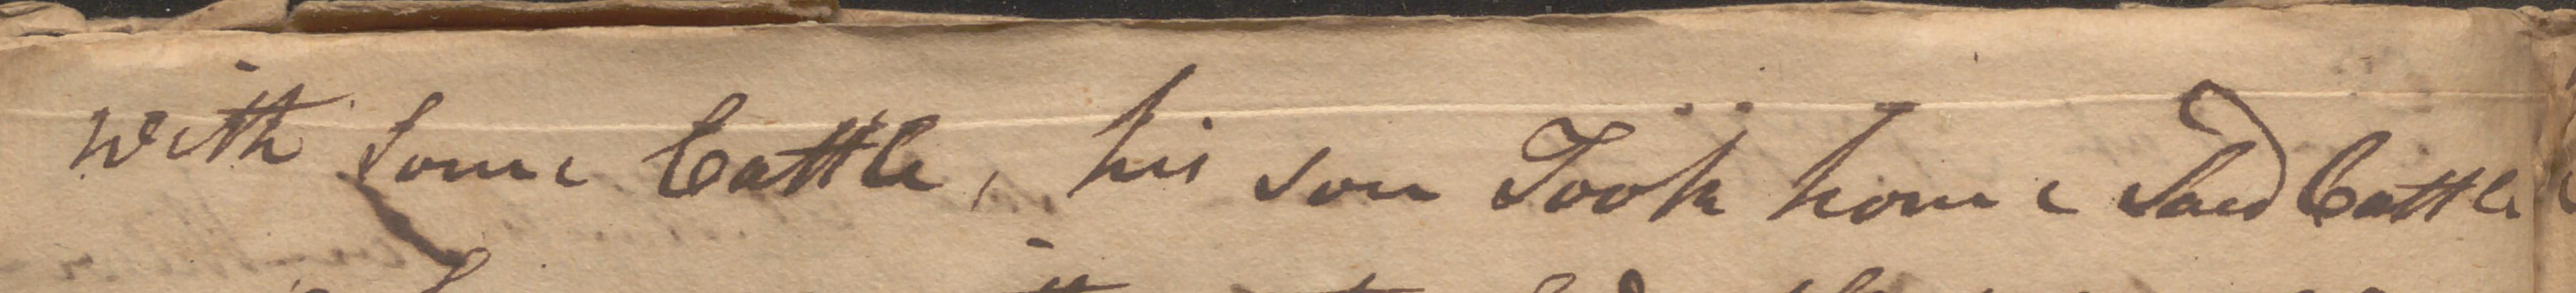with some Cattle, his son Took home said Cattle
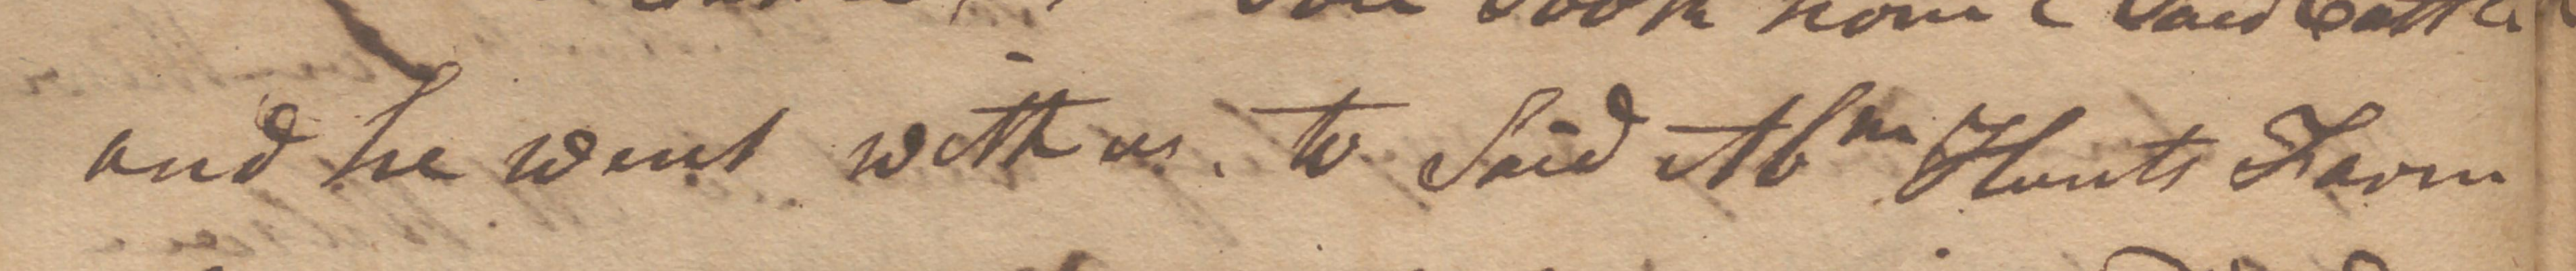and he went with us to said Ab^m Hunts Farm
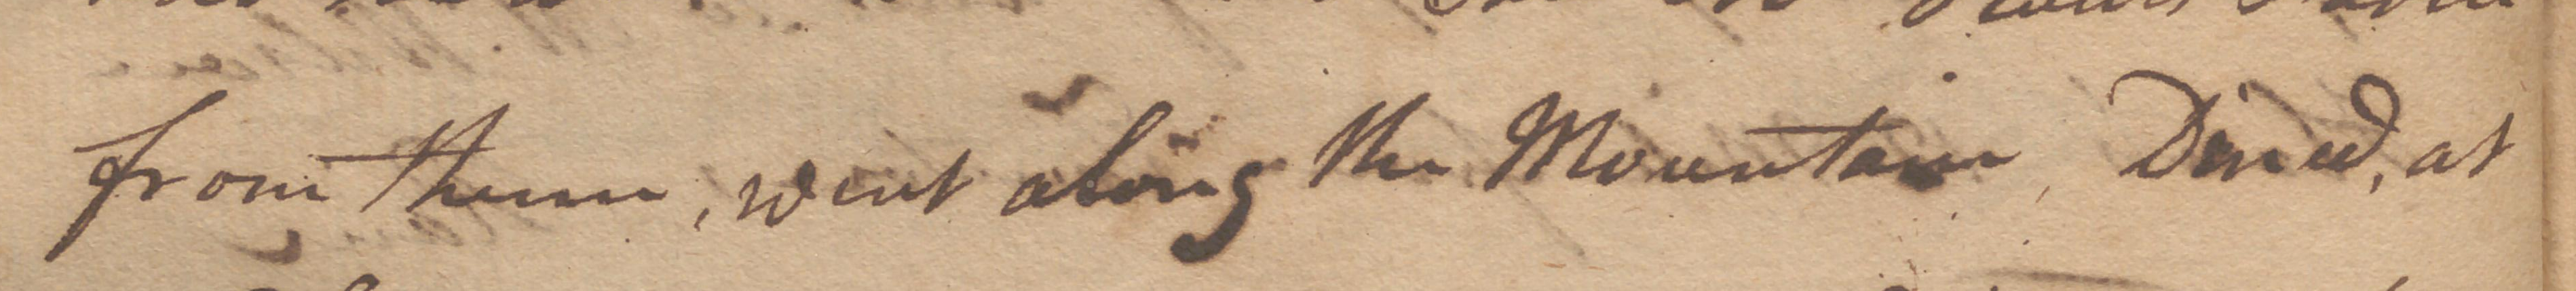from thence, went along the Mountain, Dined at
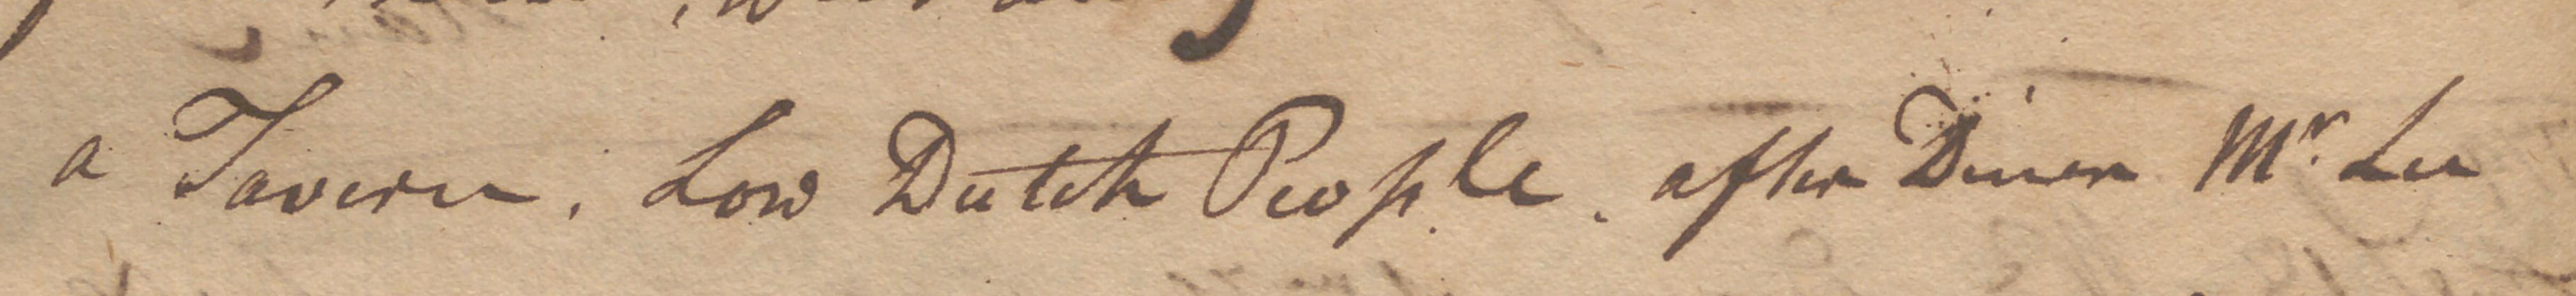a Tavern, Low Dutch People after Diner M^r. Lee
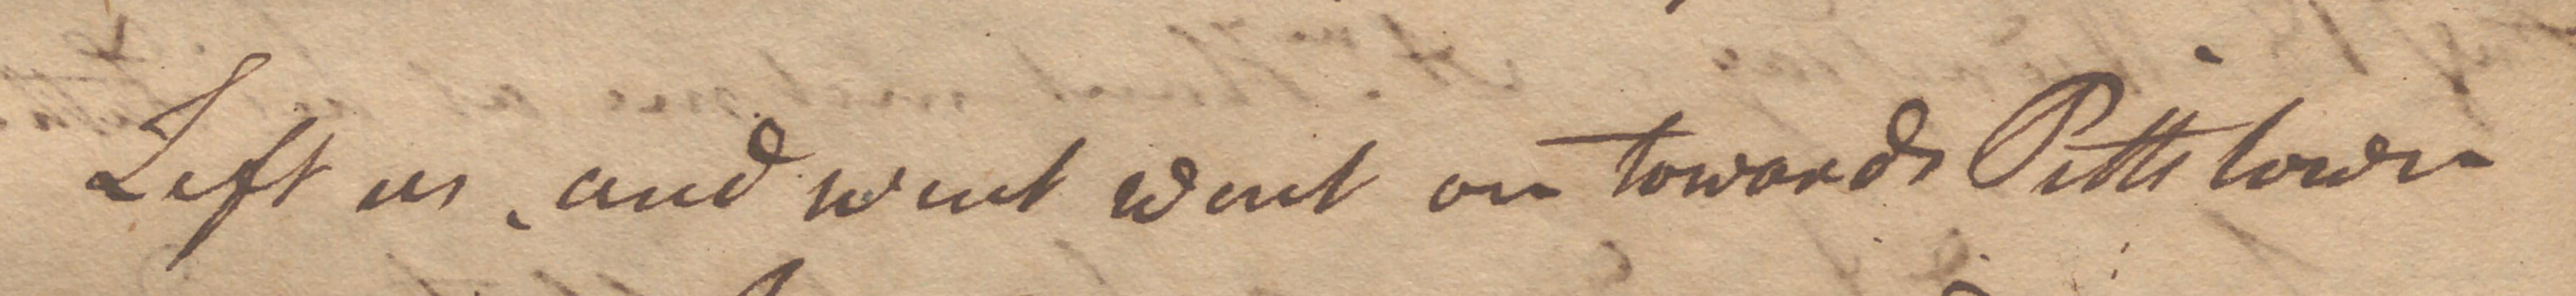Left us, and went went on towards Pittstown
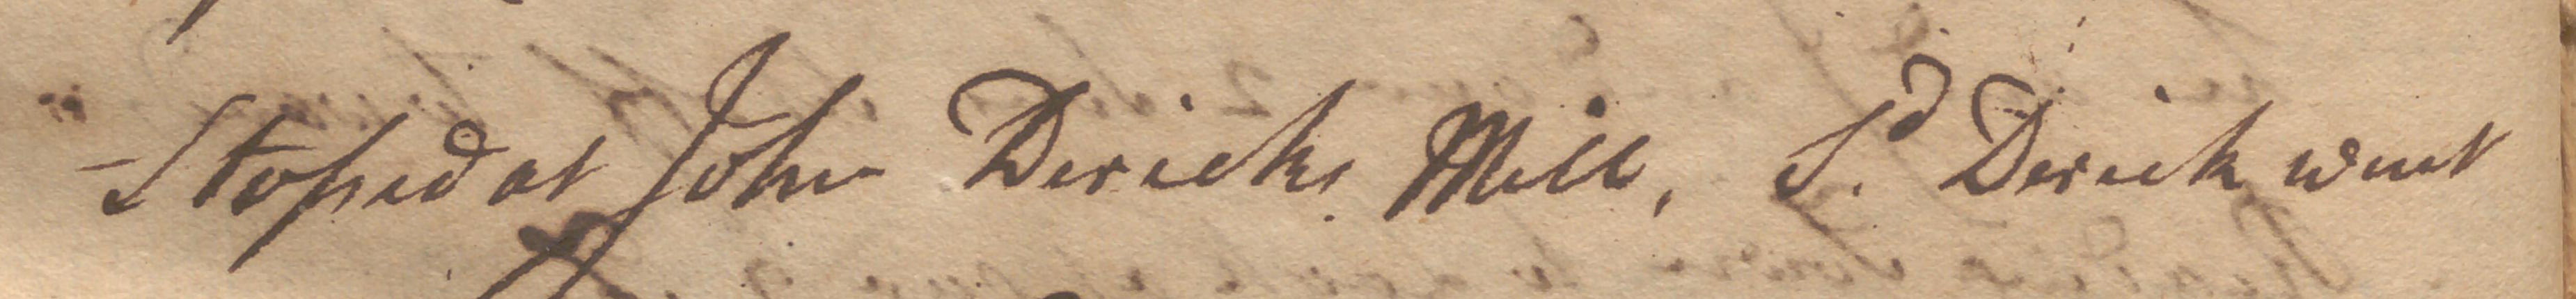Stoped at John Dericks Mill, S^d. Derick went
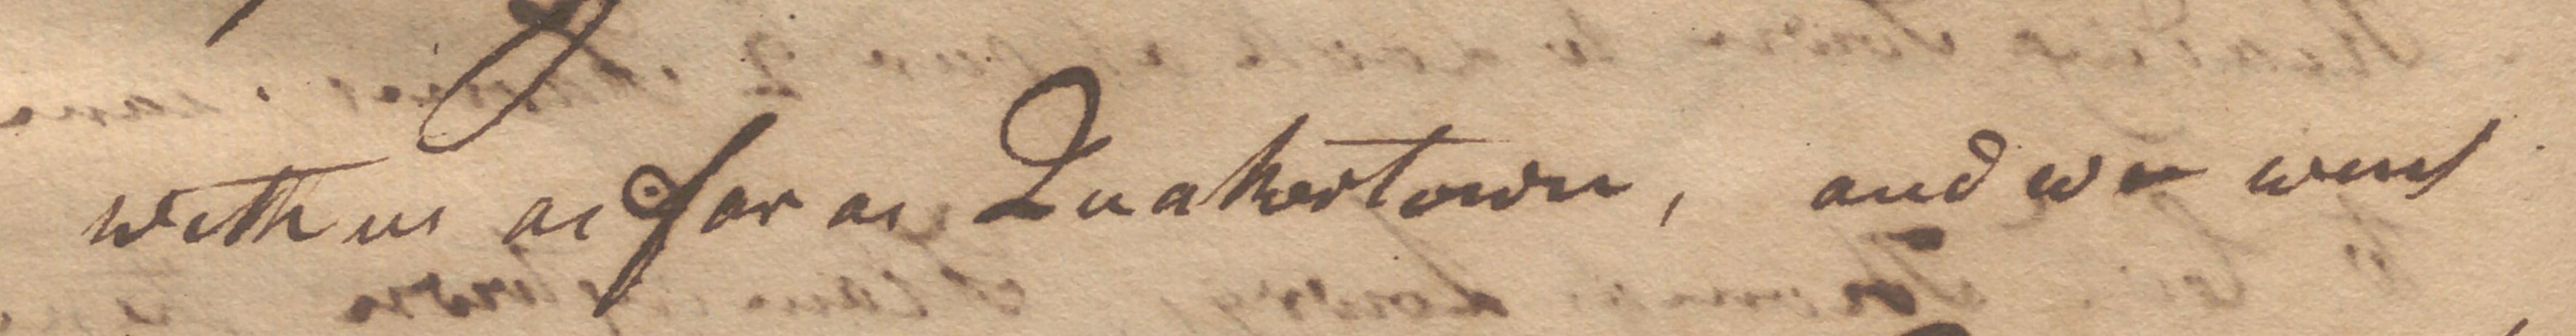with us as far as Quakertown, and we went
